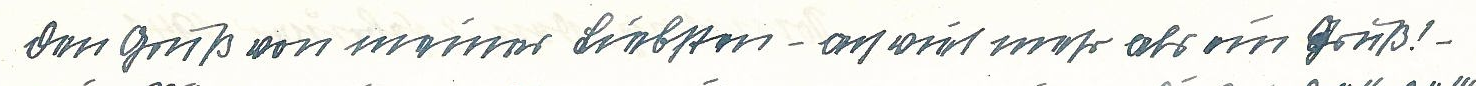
den Gruß von meiner Liebsten – ach viel mehr als ein Gruß! –
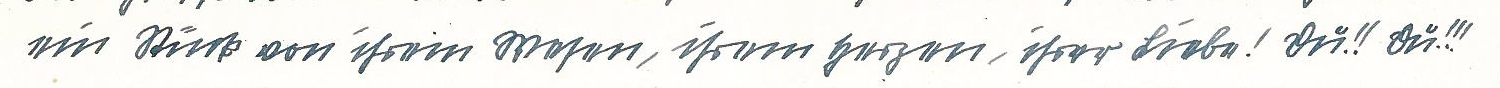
ein Stück von ihrem Wesen, ihrem Herzen, ihrer Liebe! Du!! Du!!
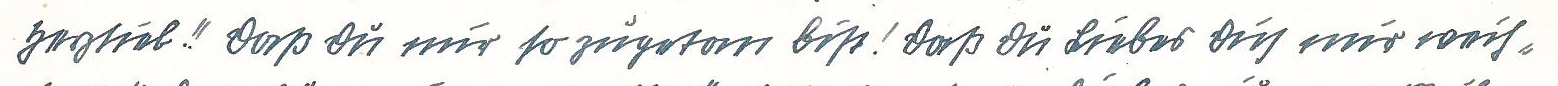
Herzlieb!! Daß Du mir so zugetan bist! Daß Du Liebes Dich mir weih¬
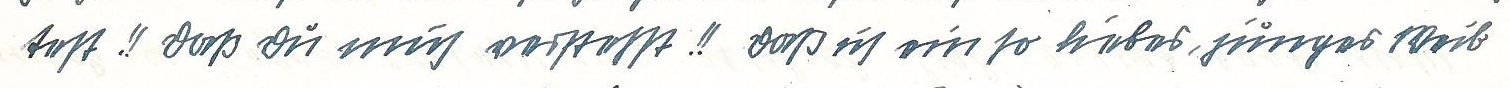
test!! Daß Du mich verstehst!! Daß ich ein so liebes, junges Weib
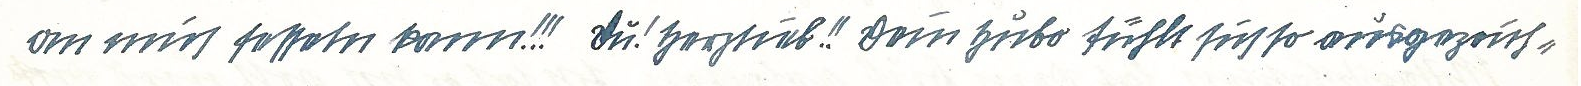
an mich fesseln kann!!! Du! Herzlieb!! Dein Hubo fühlt sich so ausgezeich¬
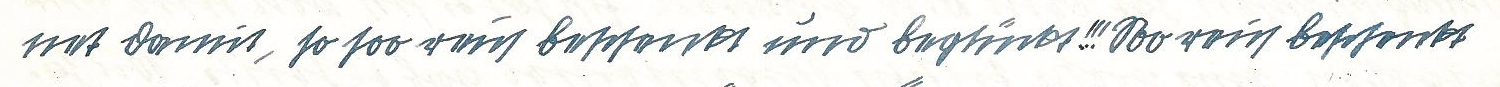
net damit, so soo reich beschenkt und beglückt!!! Soo reich beschenkt
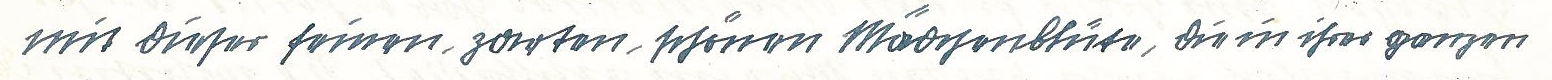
mit dieser feinen, zarten, schönen Mädchenblüte, die in ihrer ganzen
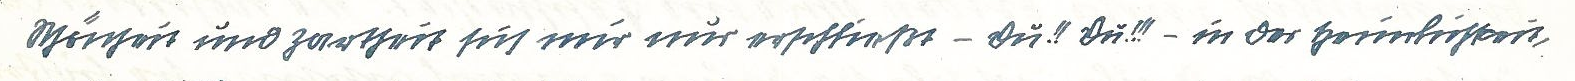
Schönheit und Zartheit sich mir nur erschließt – Du!! Du!!! – in der Heimlichkeit,
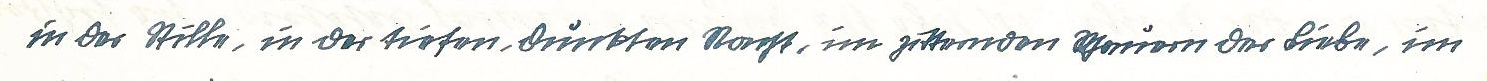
in der Stille, in der tiefen, dunklen Nacht, im zitternden Schauern der Liebe, im
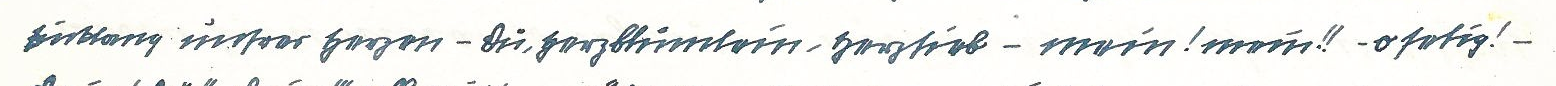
Einklang unsrer Herzen – Du, Herzblümlein, Herzlieb – mein! Mein!! – oh selig! –
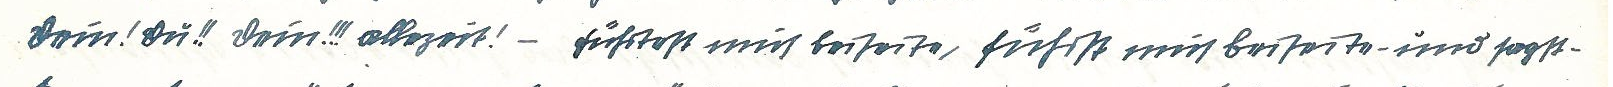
Dein! Du!! Dein!!! allezeit! – führtest mich beiseite, führst mich beiseite – und sagst –
